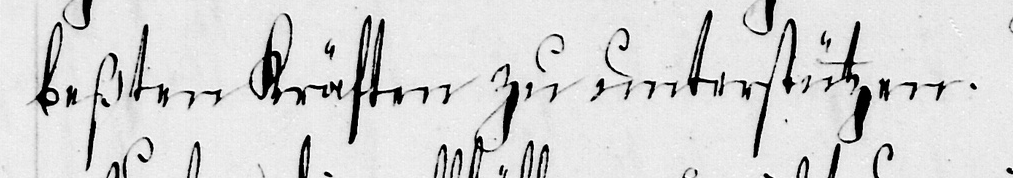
beßten Kräften zu unterstützen.
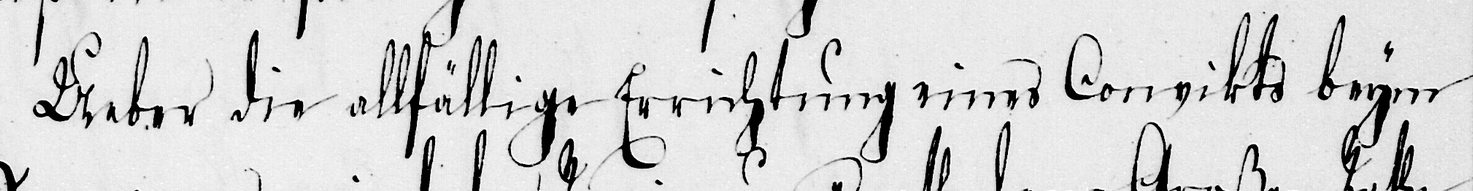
Ueber die allfällige Errichtung eines Convikts beym
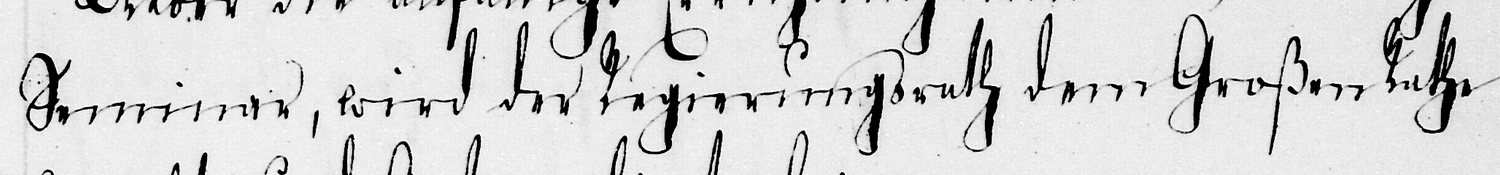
Seminar, wird der Regierungsrath dem Großen Rathe
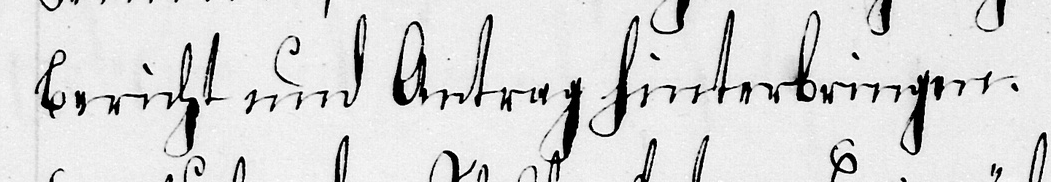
Bericht und Antrag hinterbringen.
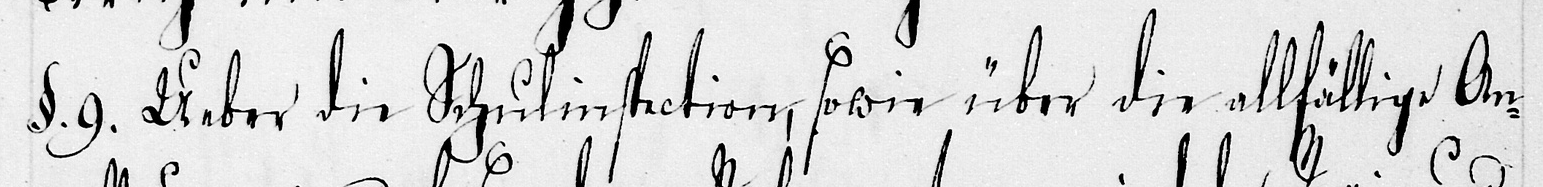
§. 9. Ueber die Schulinspection, sowie über die allfällige An¬
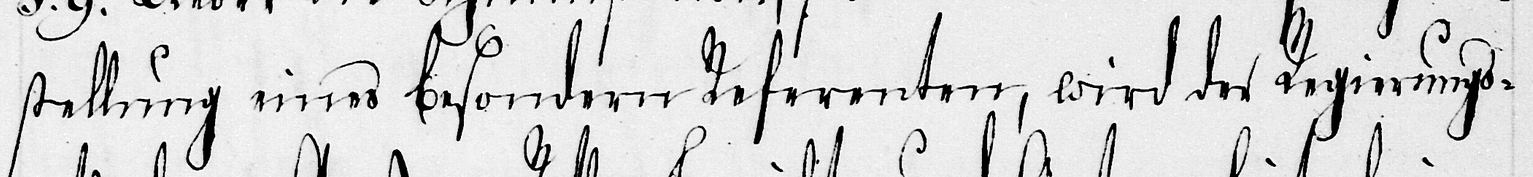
stellung eines besondern Referenten, wird der Regierungs¬
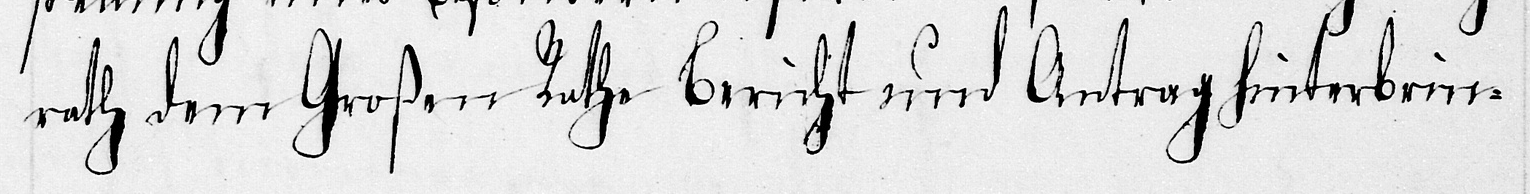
rath dem Großen Rathe Bericht und Antrag hinterbrin¬
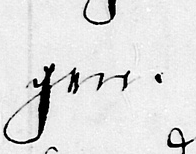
gen.
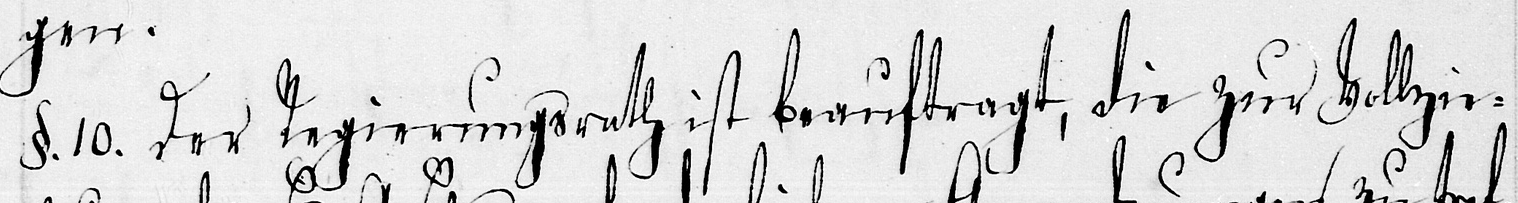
§. 10. Der Regierungsrath ist beauftragt, die zur Vollzie¬
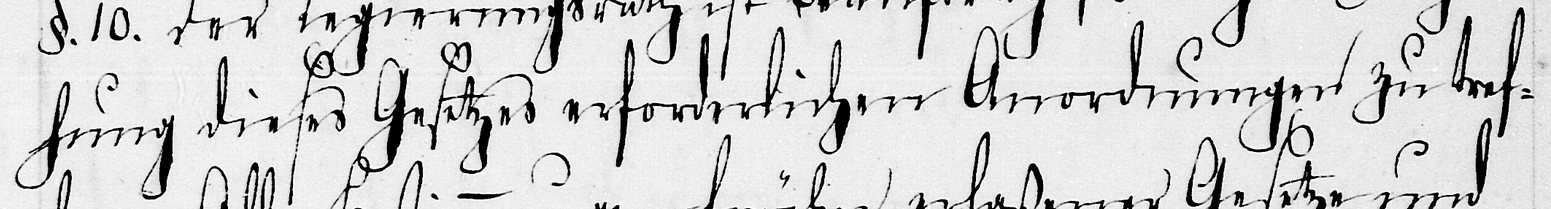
hung dieses Gesetzes erforderlichen Anordnungen zu tref¬
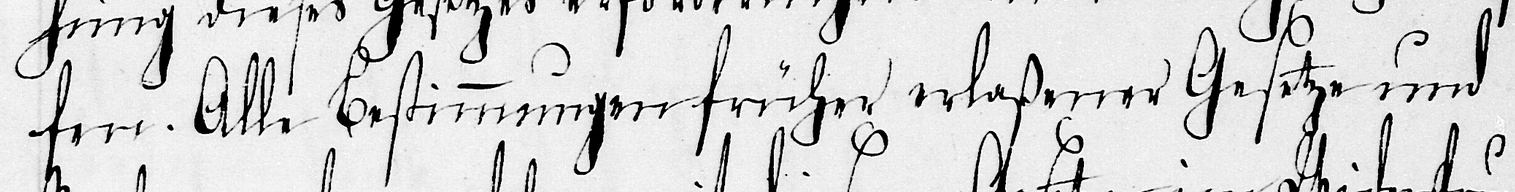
fen. Alle Bestimmungen früher erlaßener Gesetze und
